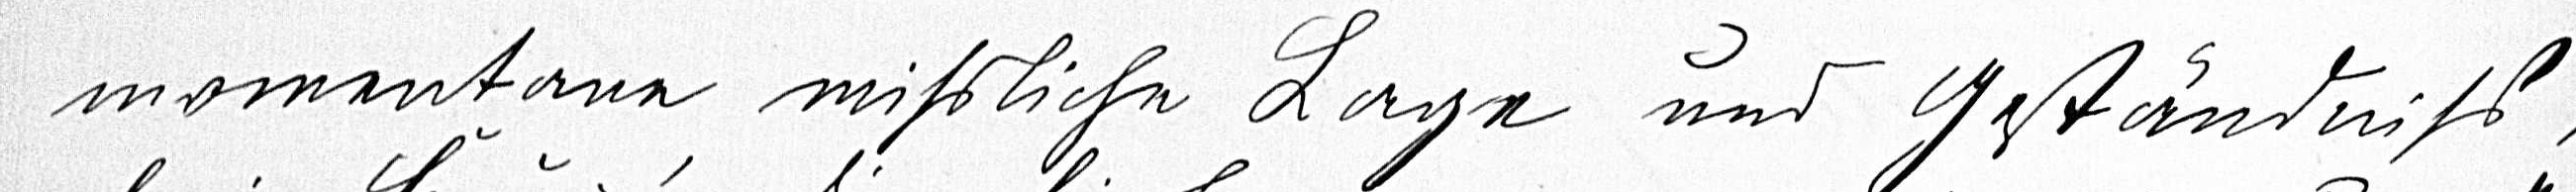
momentane mißliche Lage und Geständniß,
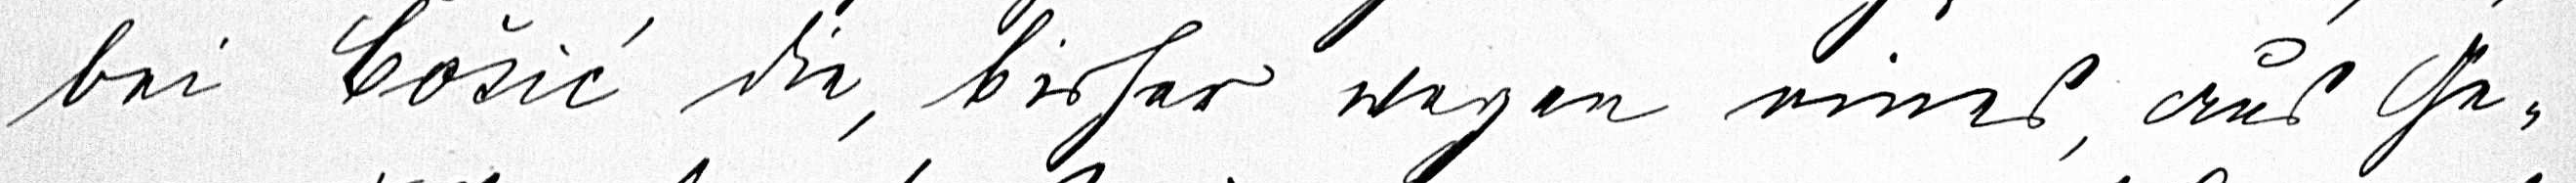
bei Čošić die, bisher wegen eines, aus Ge¬
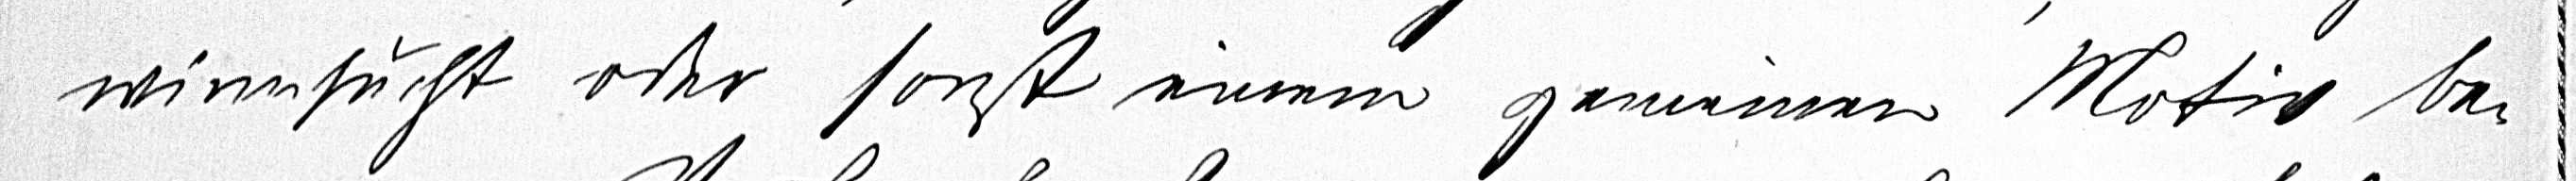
winnsucht oder sonst einem gemeinen Motiv be¬
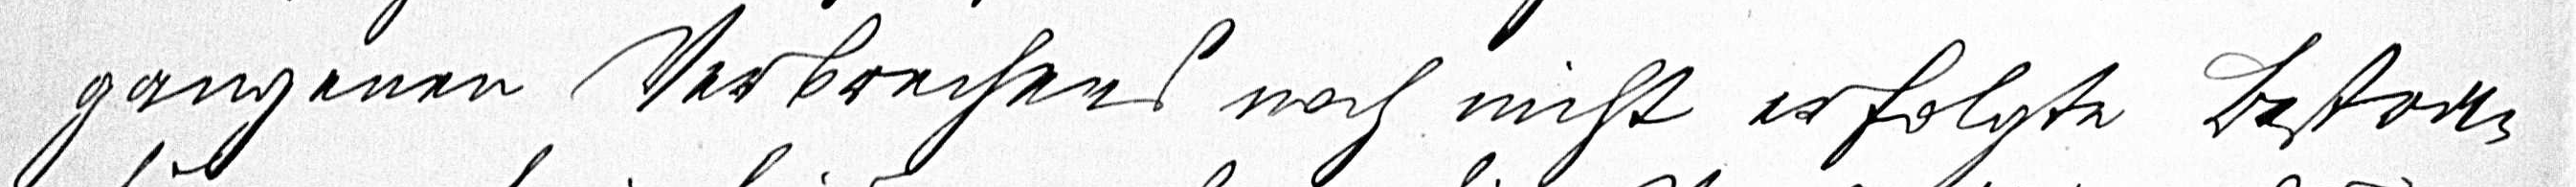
gangenen Verbrechens noch nicht erfolgte Bestra¬
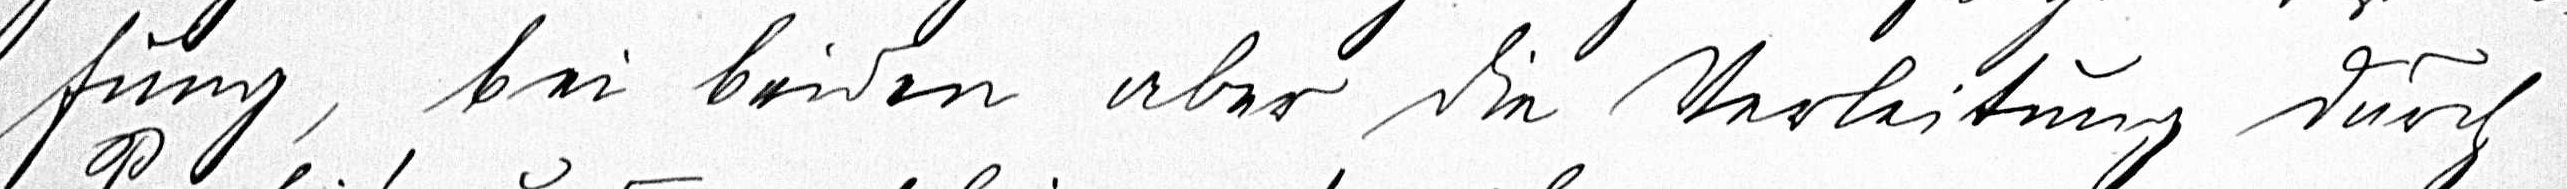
fung, bei beden aber die Verleitung durch
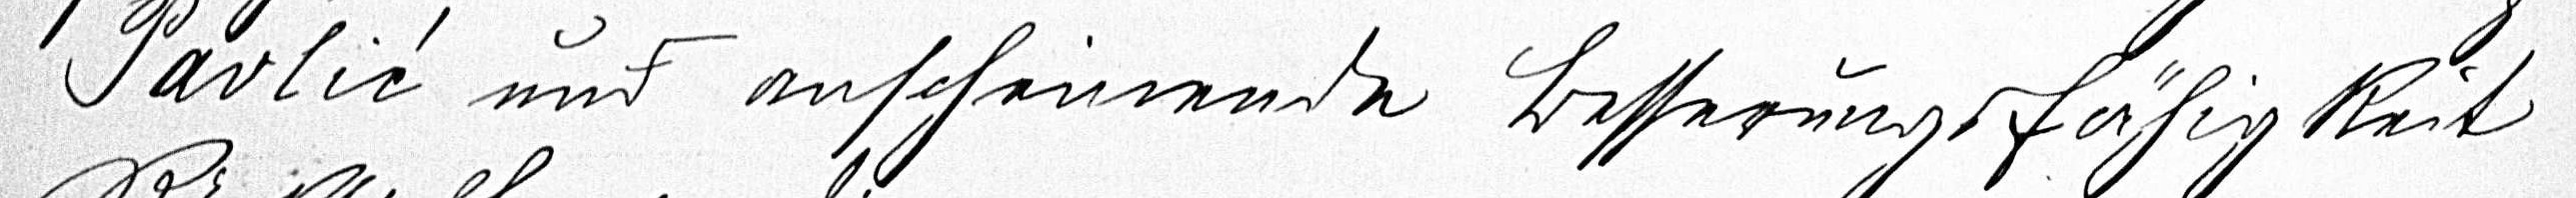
Pavlić und auscheinende Besserungsfähigkeit
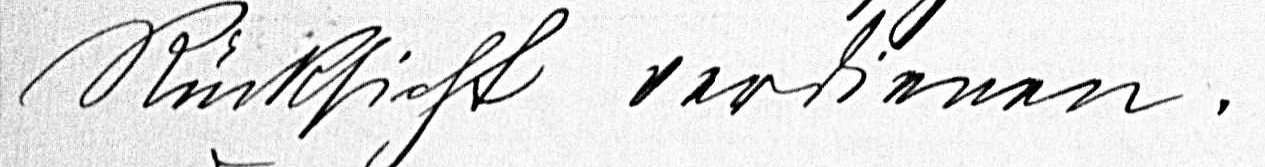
Rücksicht verdienen.
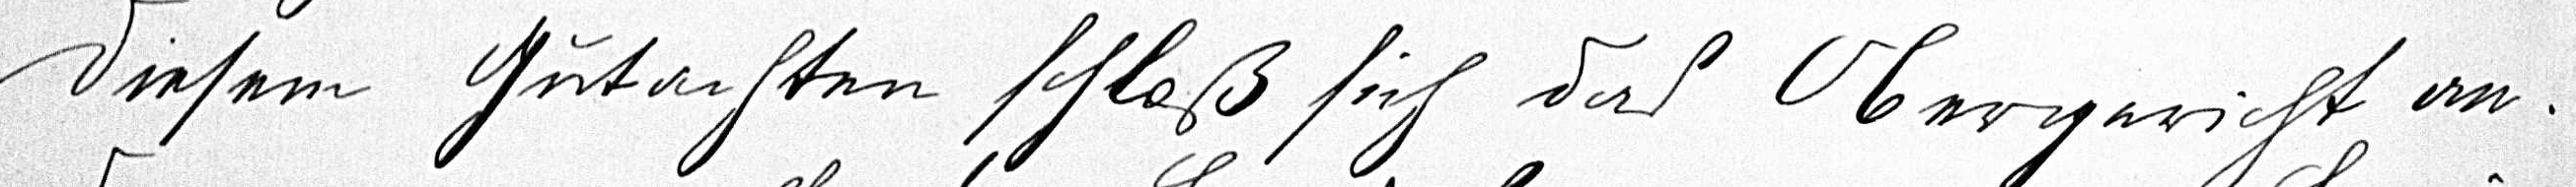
Diesem Gutachten schloß sich das Obergericht an.
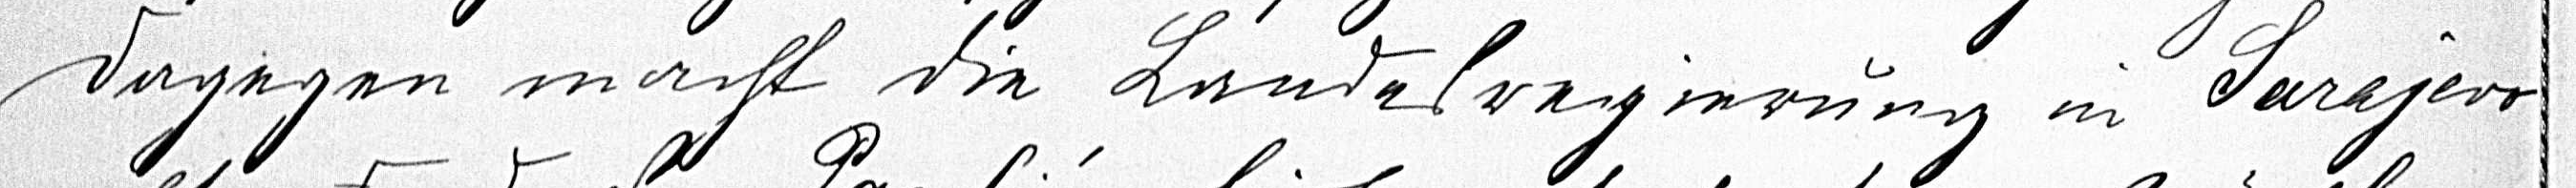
Dagegen macht die Landesregierung in Sarajevo
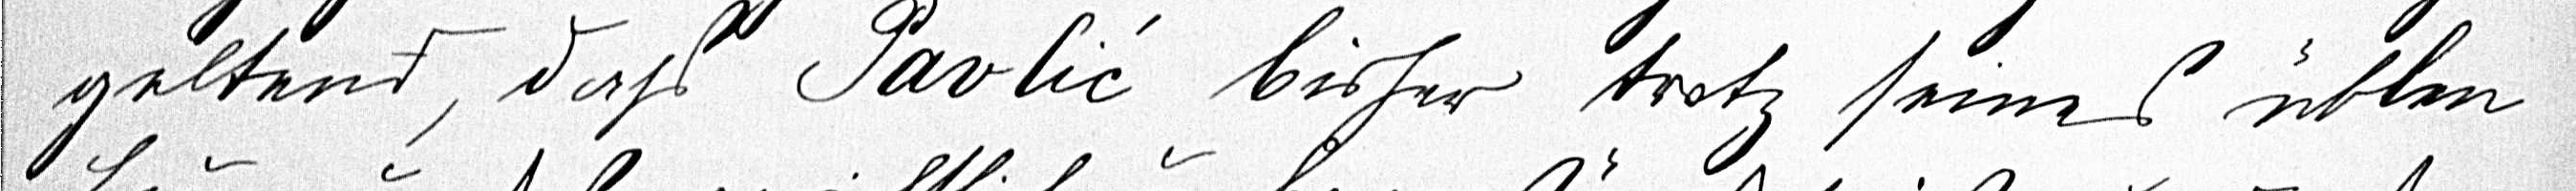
geltend, daß Pavlić bisher trotz seines üblen
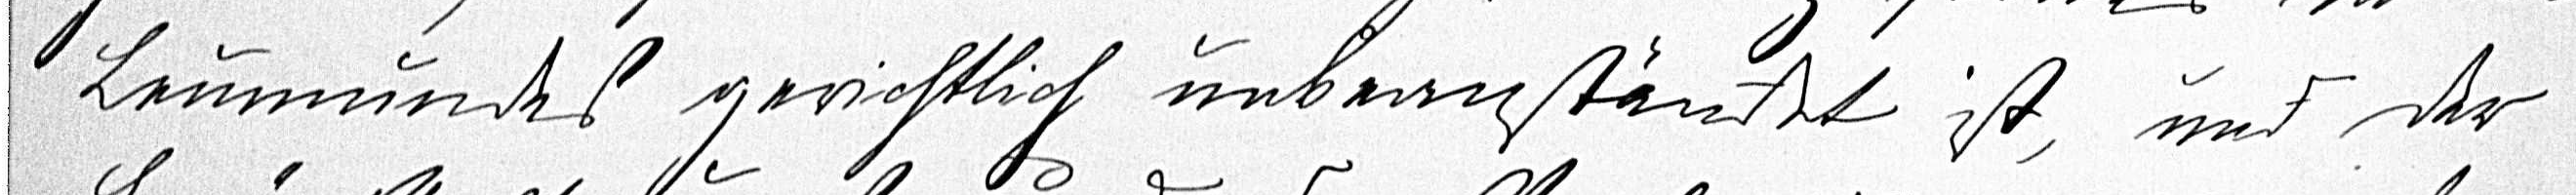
Leumundes gerichtlich unbeanständet ist, und der
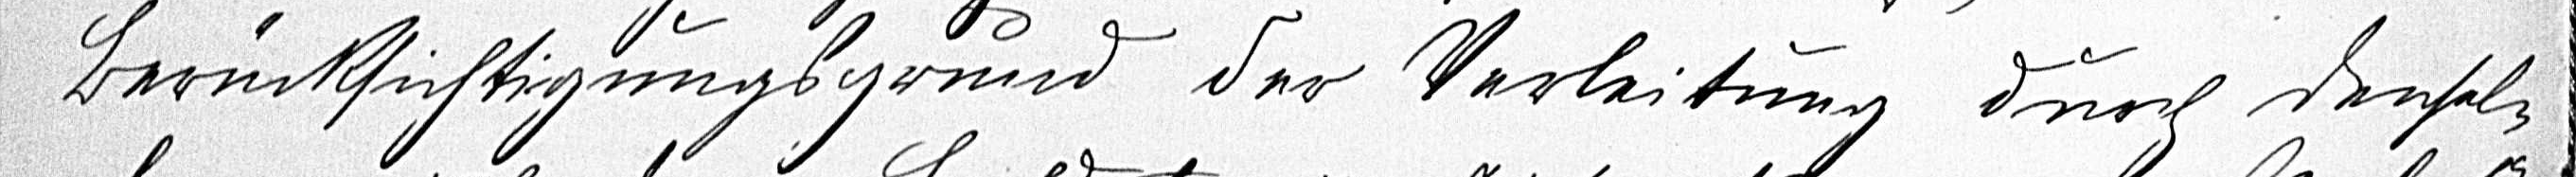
Berücksichtigungsgrund der Verleitung durch densel¬
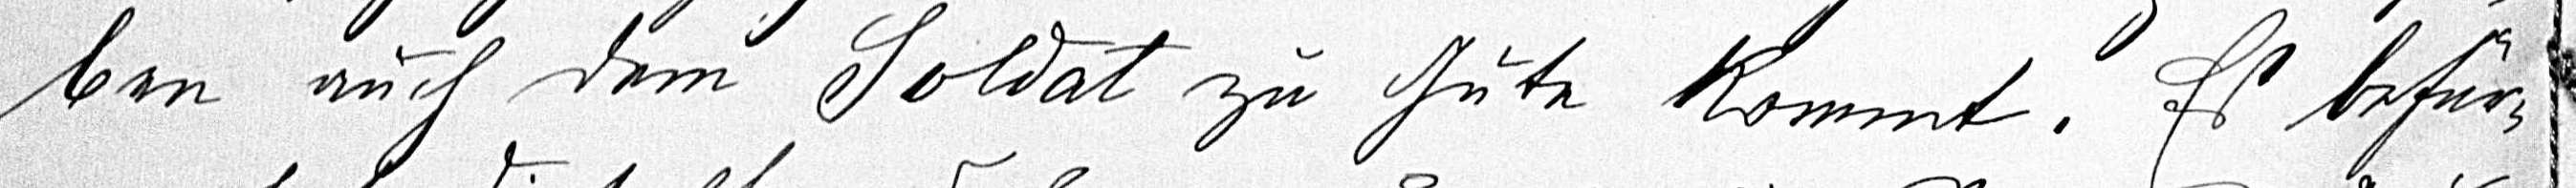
ben auch dem Soldat zu Gute kommt. Es befür¬
